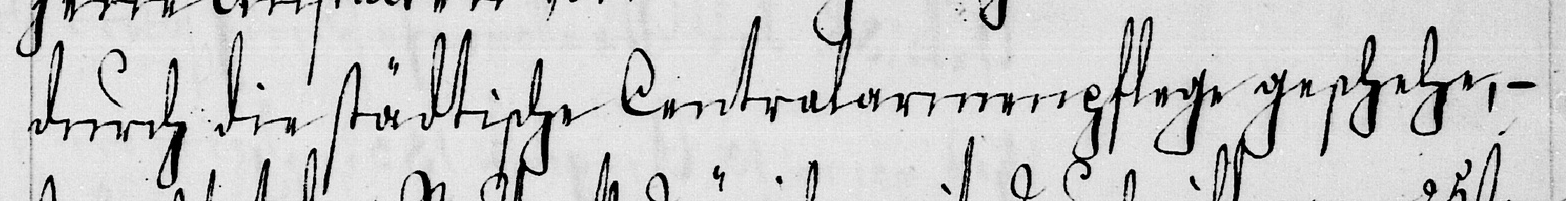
durch die tägliche Centralarmenpflege geschehe, –
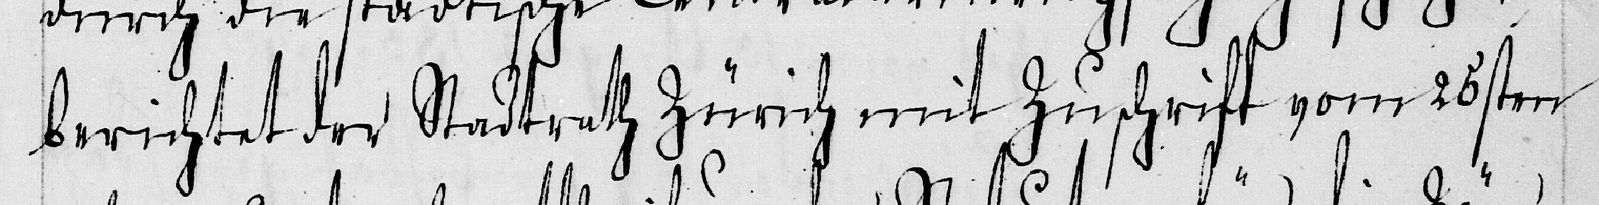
berichtet der Stadtrath Zürich mit Zuschrift vom 25sten
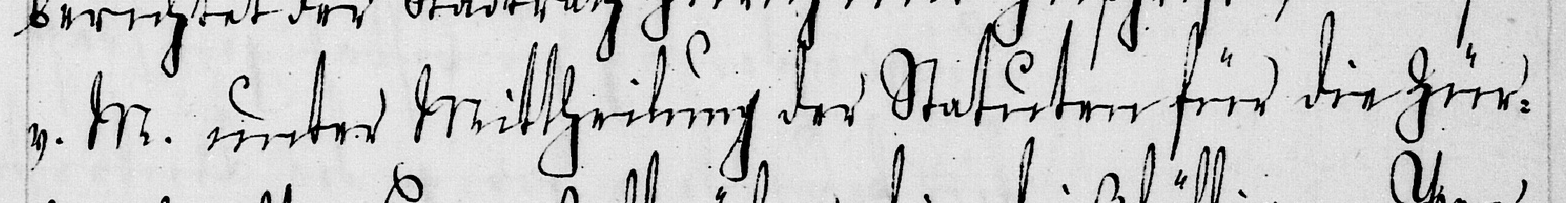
v. M. unter Mittheilung der Statuten für die Zür¬
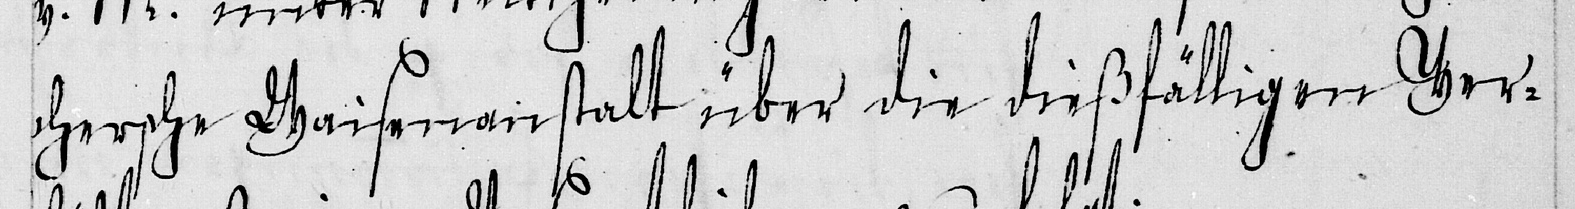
chersche Waisenanstalt über die dießfälligen Ver¬
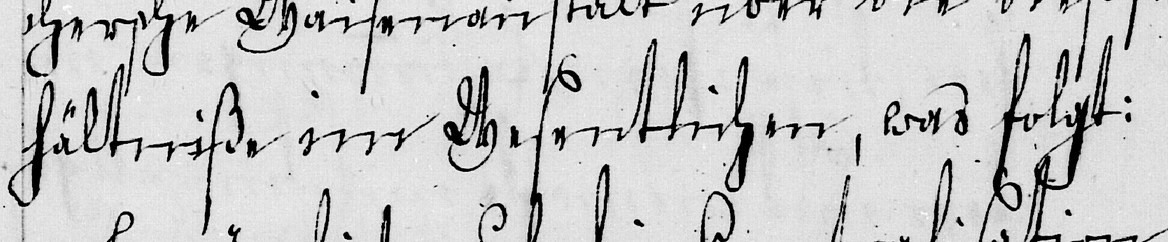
hältniße im Wesentlichen, was folgt:
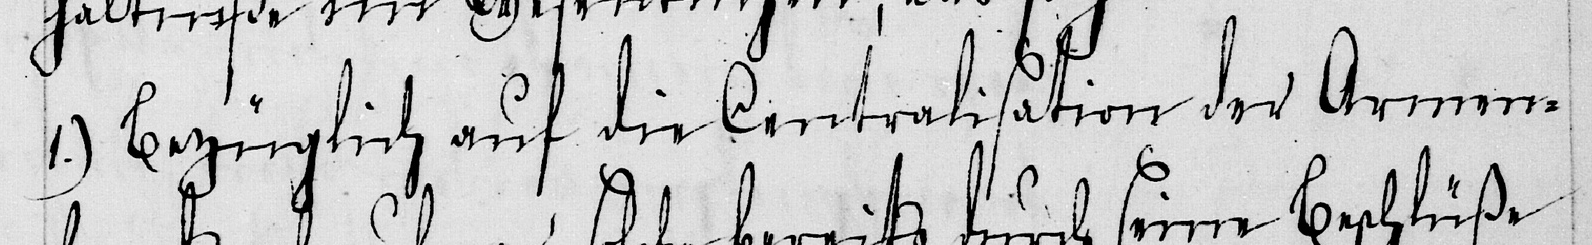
1.) Bezüglich auf die Centralisation der Armen¬
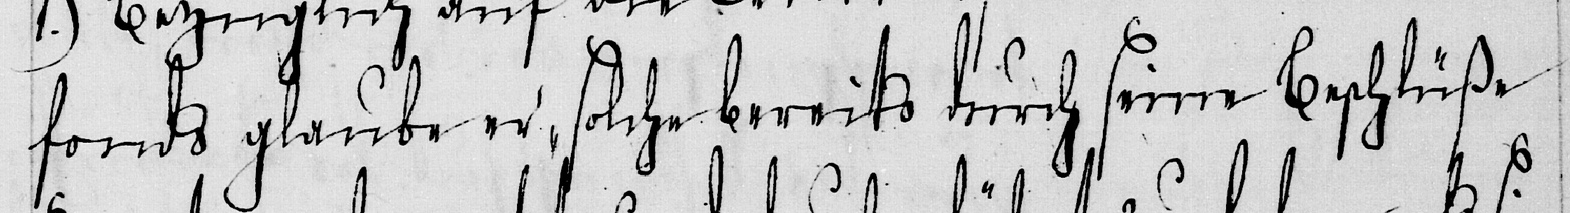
fonds glaube er, solche bereits durch seine Beschlüße
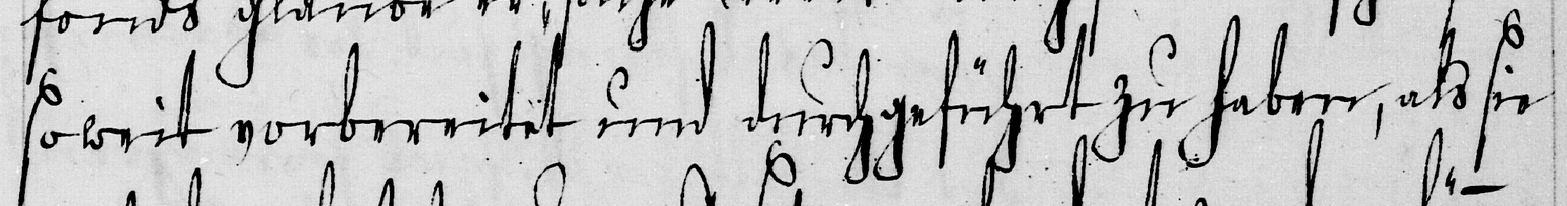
soweit vorbereitet und durchgeführt zu haben, als sie
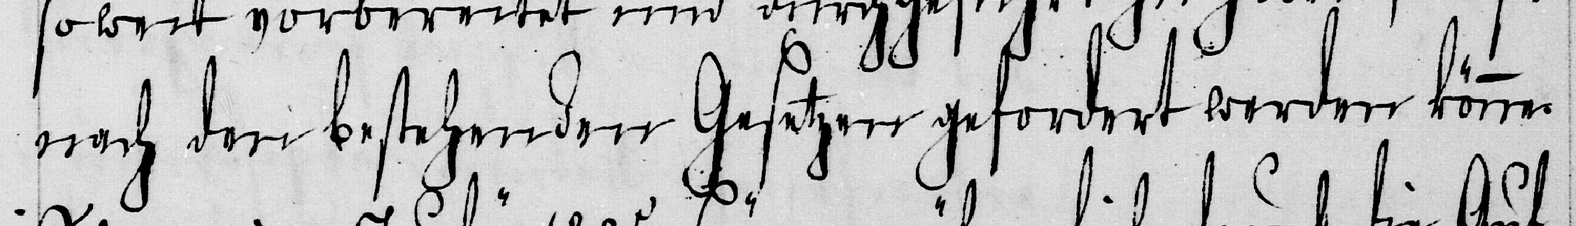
nach den bestehenden Gesetzen gefordert werden könne.
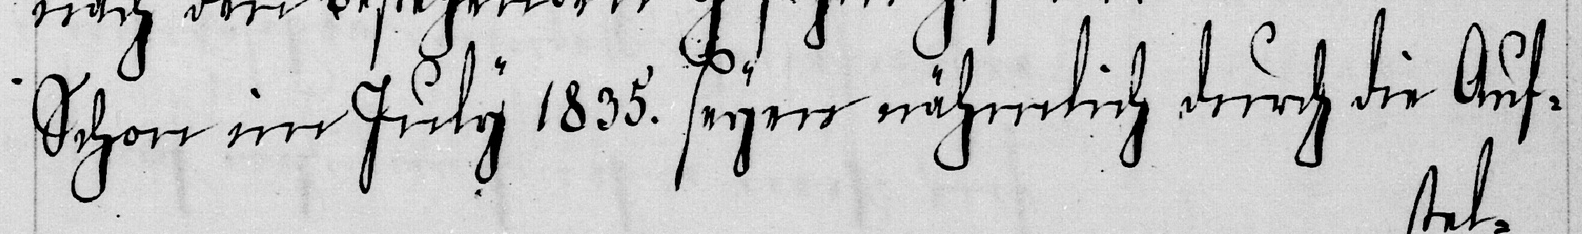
Schon im July 1835. seyen nähmlich durch die Auf-
